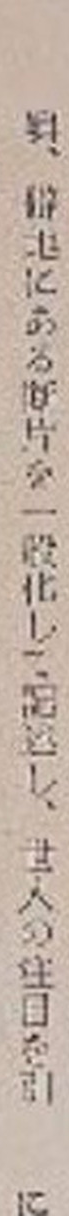嶼、僻地にある断片を一般化して記述し、世人の注目を引
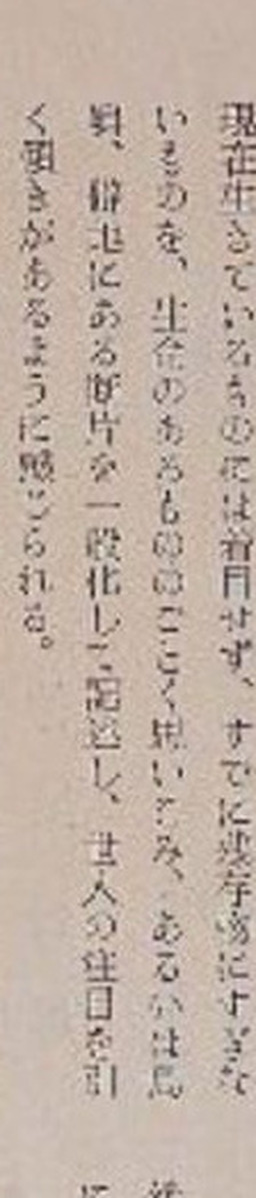嶼、僻地にある断片を一般化して記述し、世人の注目を引
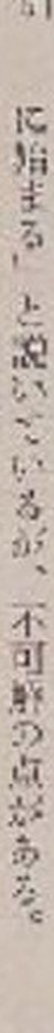に始まる」と説いているが、不可解の点がある。
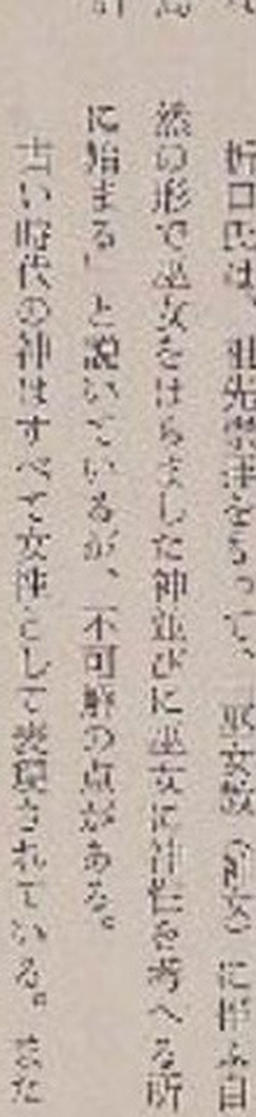に始まる」と説いているが、不可解の点がある。
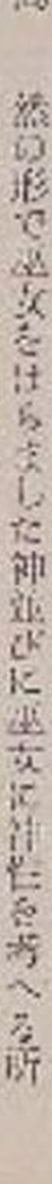然の形で巫女をはらました神並びに巫女に神性を考へる所
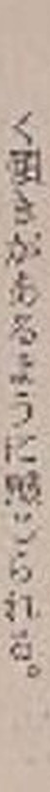く傾きがあるように感じられる。
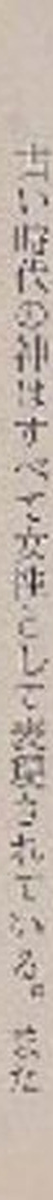古い時代の神はすべて女性として表現されている。また
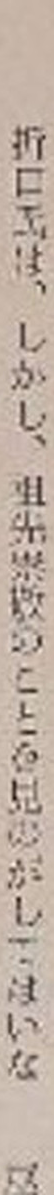折口氏は、しかし、祖先崇敬のことを見のがしてはいな
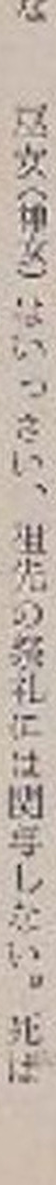巫女(神女)はいっさい、祖先の祭礼には関与しない。死は
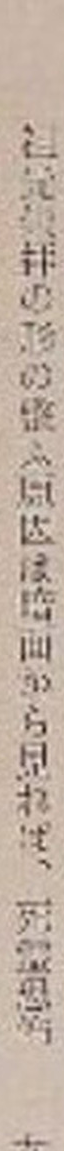祖先崇拝の形の整ふ原因は暗面から見れば、死霊恐怖
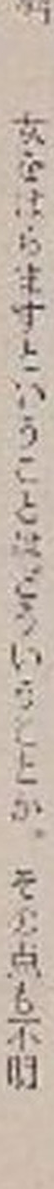女をはらますということはどういうことか。その点も不明
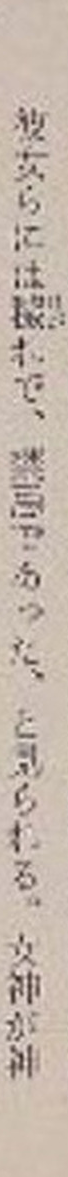神女らには穢れで、禁忌であった、と見られる。女神が神
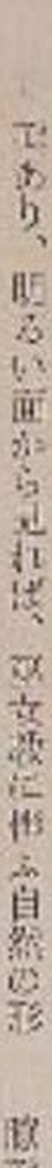であり、明るい面から見れば、巫女教に伴ふ自然の形
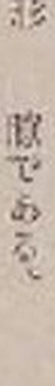瞭である。
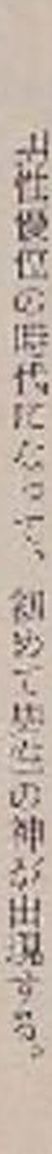男性優位の時代になって、初めて男性の神が出現する。
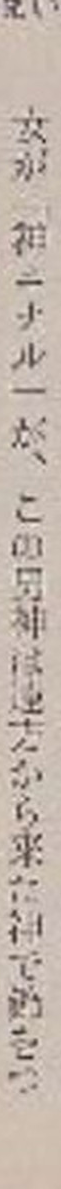女が「神ニナル」が、この男神は遠方から来た神で鈴をつ
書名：沖縄固有信仰のおとろえ
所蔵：University of the Ryukyus Library
